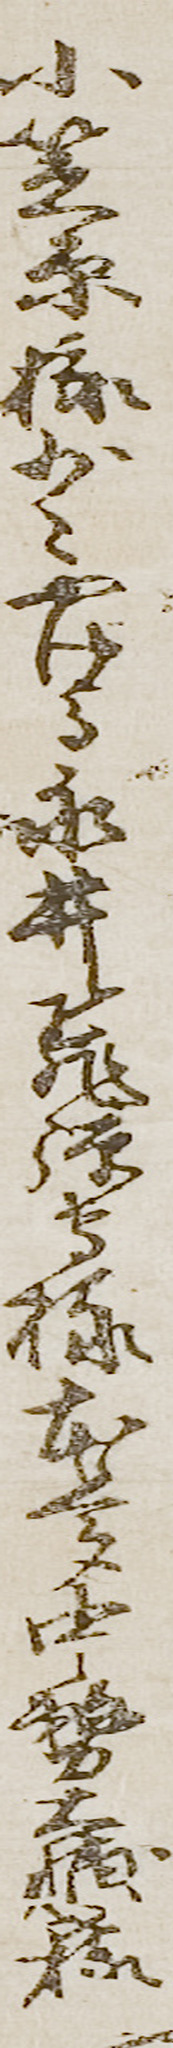小笠原様少々やける永井飛騨守様本多中務大輔様
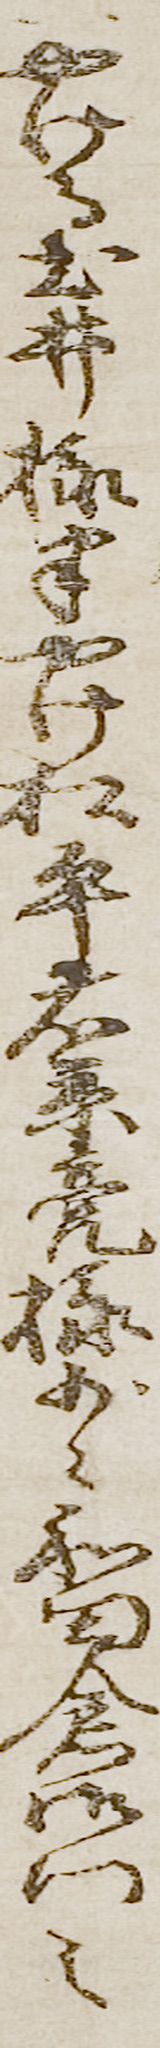やける土井様半やけ松平右京亮様少々和田倉御門の
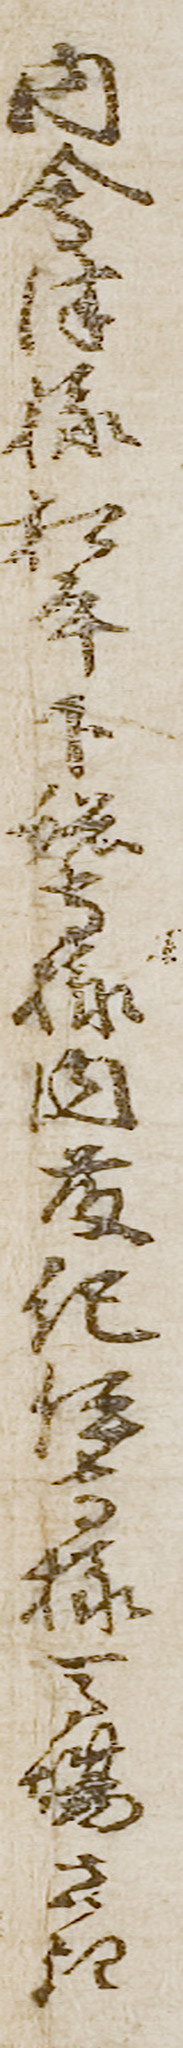内会津様松平下総守様内藤紀伊守様馬場さき
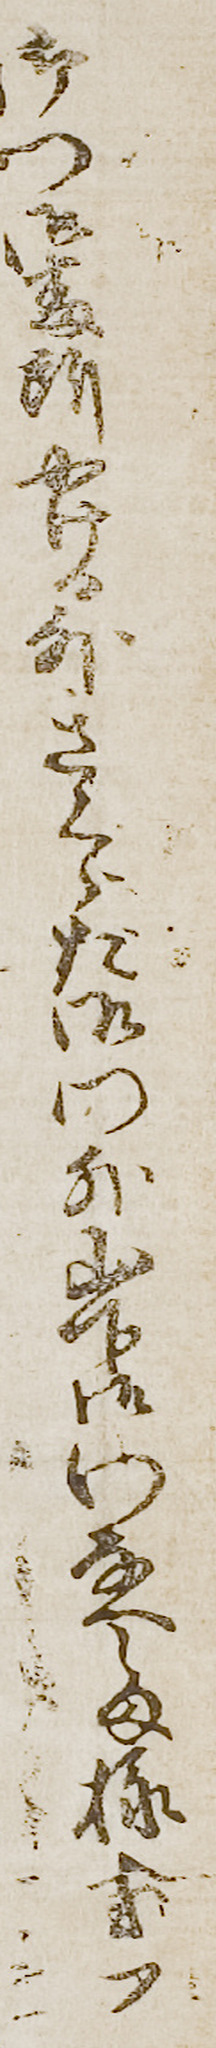御門御番所やける外さくらだ御門外山下御門なへしま様
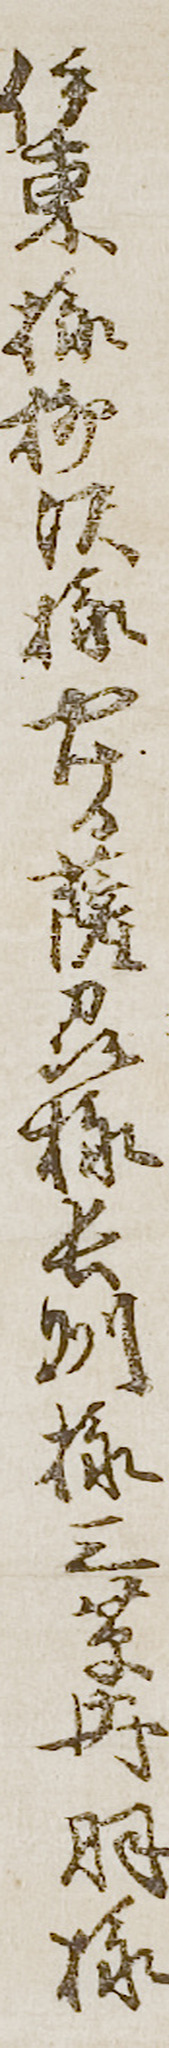伊東様柳沢様やける薩州様長州様三草丹羽様
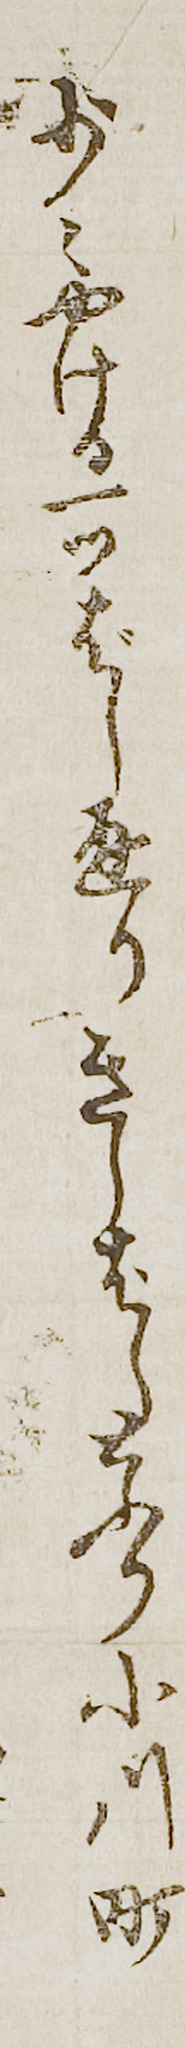少々やける一つばし通りさしはしとふり小川町
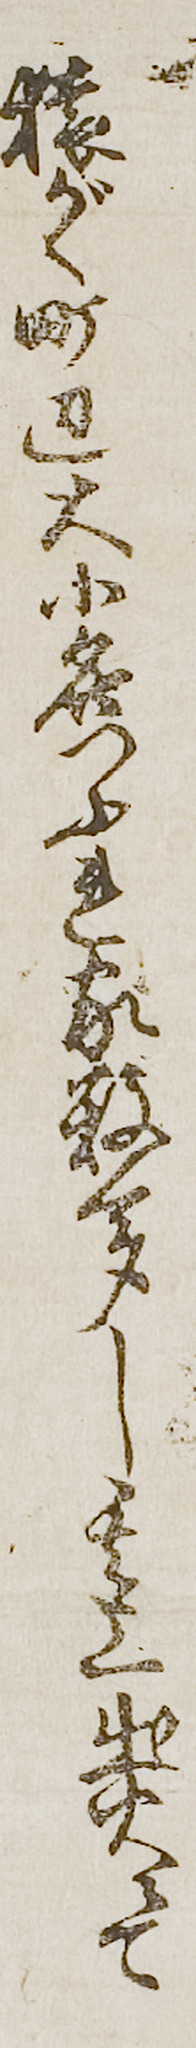猿がく町辺大小名つふれ家数多し其上出火にて
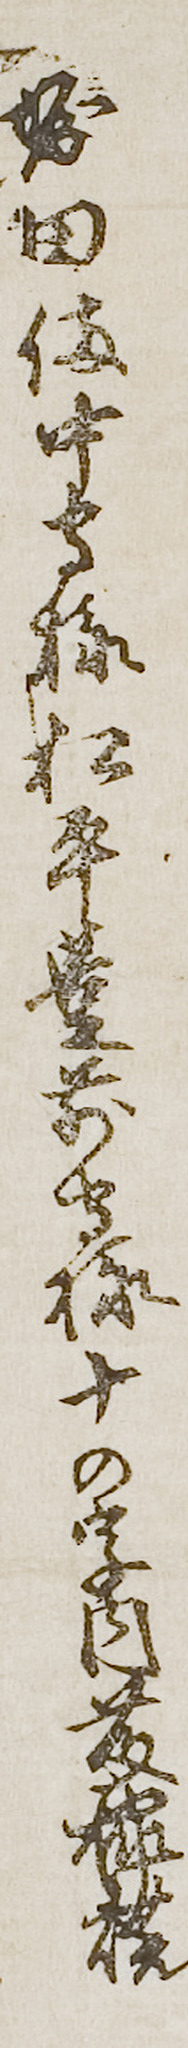堀田備中守様松平豊前守様十の字内藤様焼
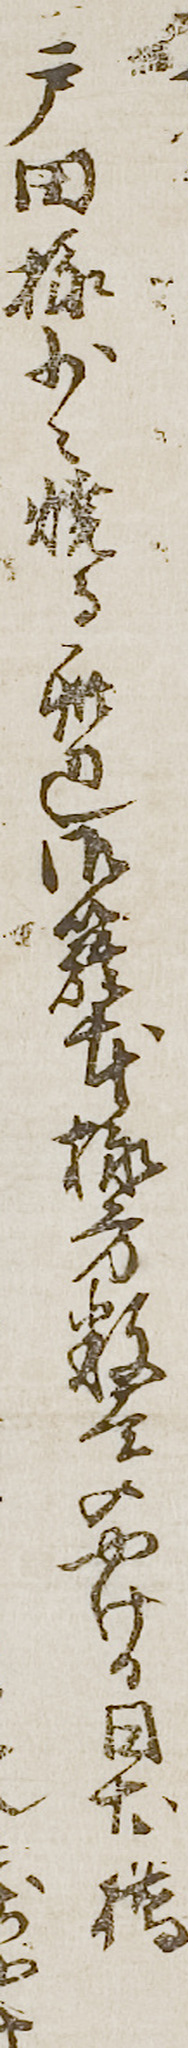戸田様少々焼る此辺御旗本様方数多やける日本橋
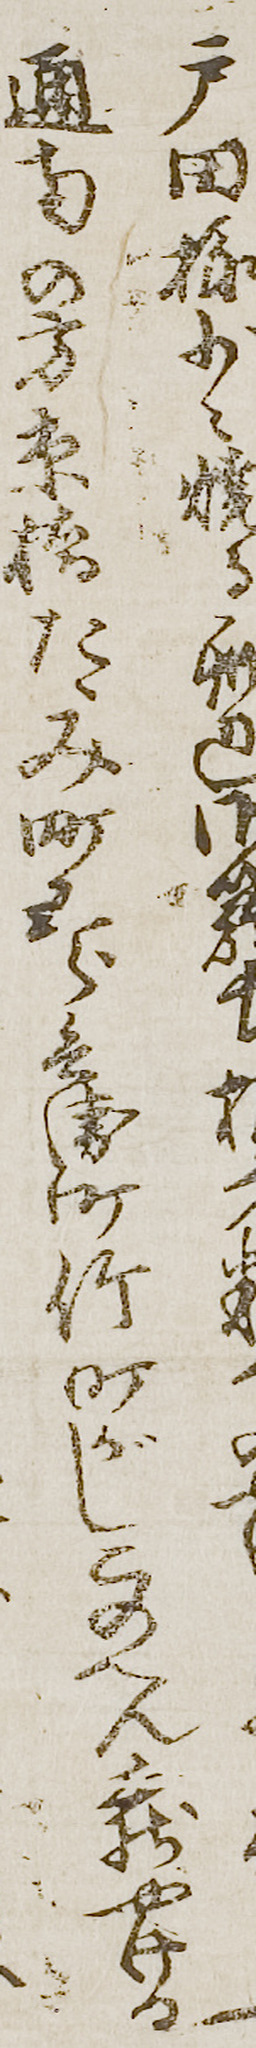通南の方東橋たゝみ町五郎兵衛町竹町がしこのへん蔵やける
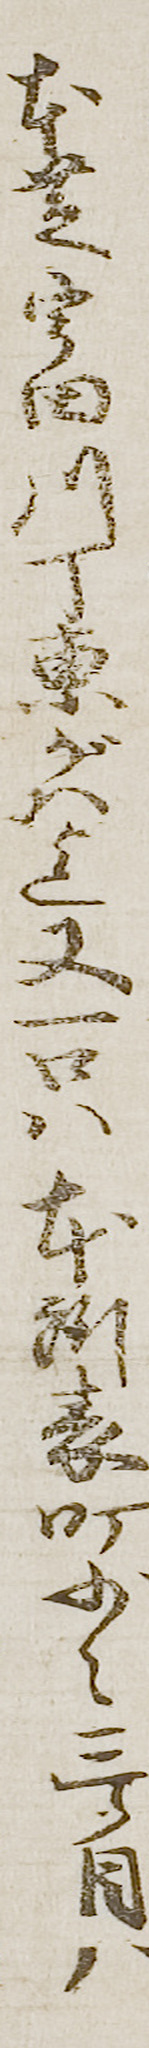本芝宇田川丁東がは迄又一口は本所表町少々三丁目は
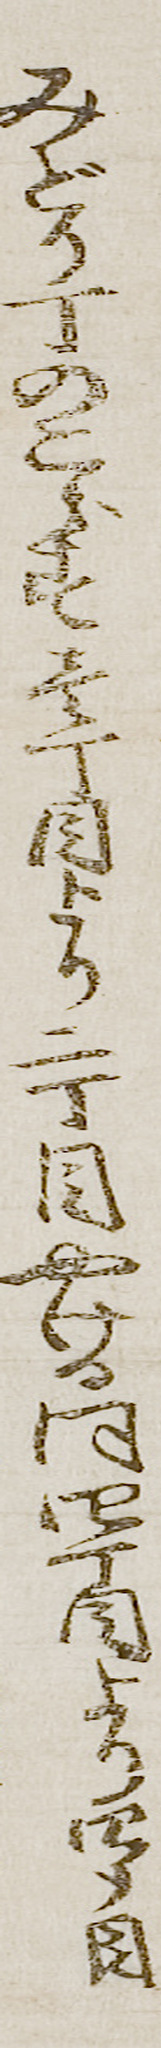みどり丁のこらす壱丁目より二丁目やける同四丁目より四ツ目
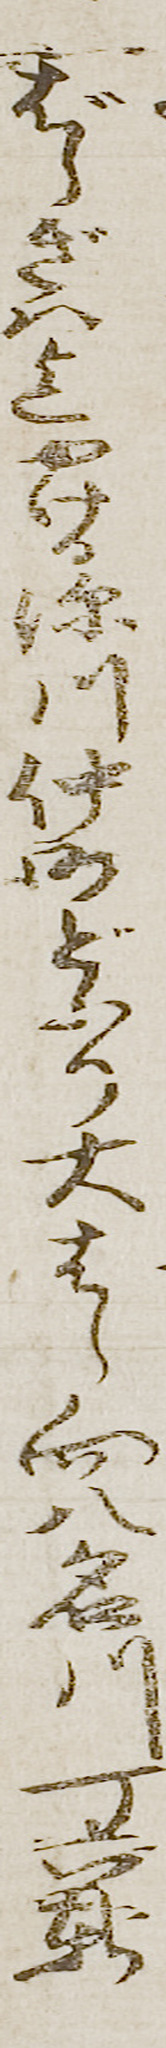ばしぎは迄やける深川仲町どふり大はし向八名川丁六軒
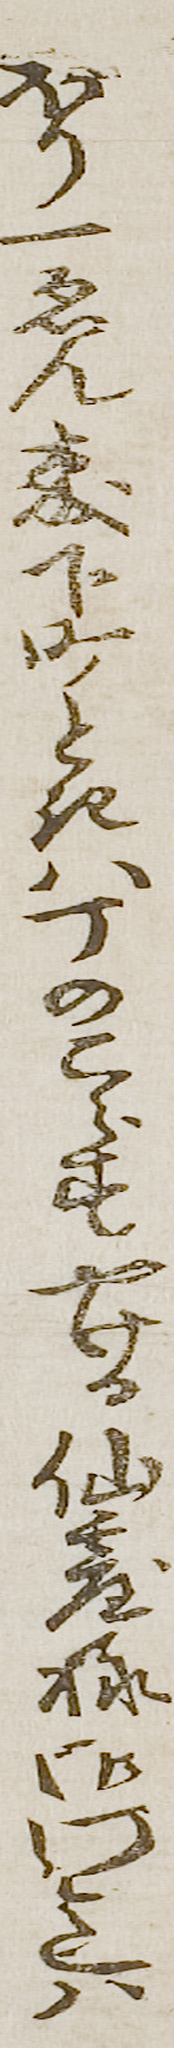ふり一ゑん森下町ときは丁のこらすやける仙台様御門迄は
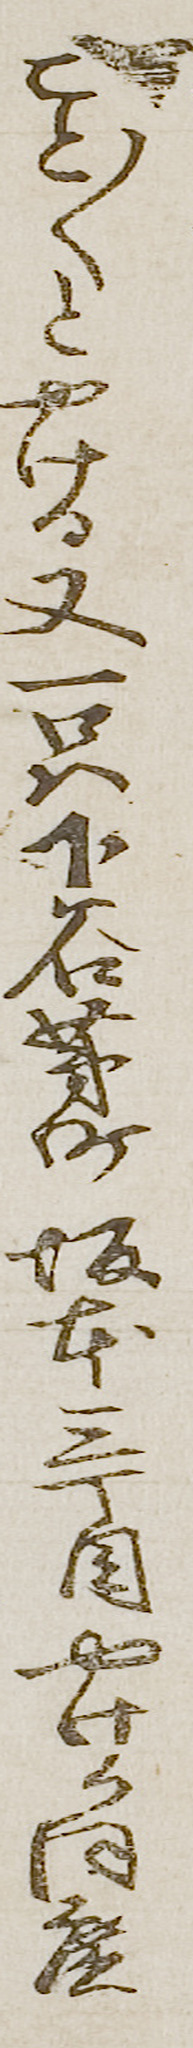こと〳〵とやける又一口は下谷茅町坂本三丁目やける同広
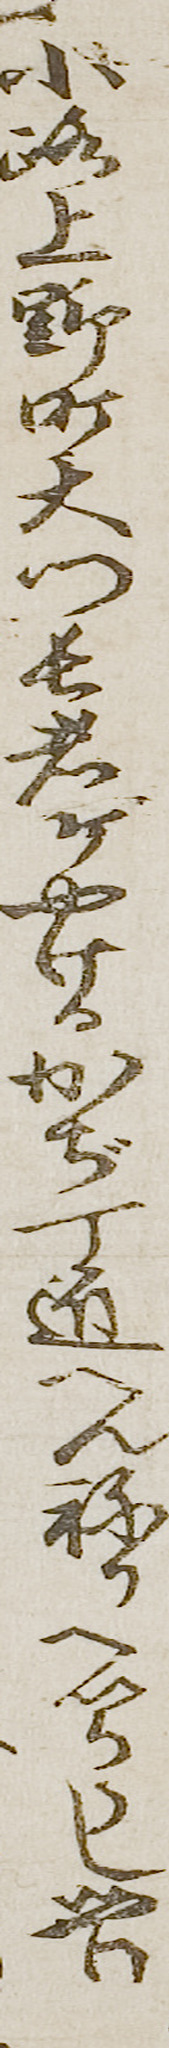小路上野町大門長者町やけるかぢ丁近へんねりへいかうしやけ
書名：江戸大地震場所附
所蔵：東京大学総合図書館 General Library in the University of Tokyo, JAPAN
